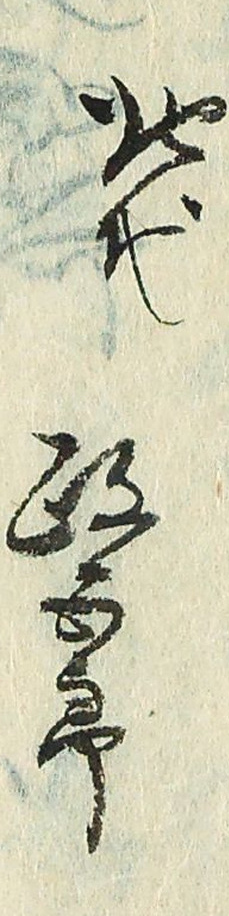北地政五郎
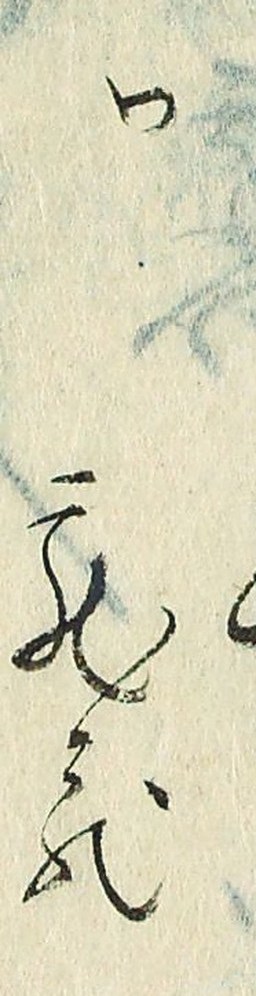同庄蔵
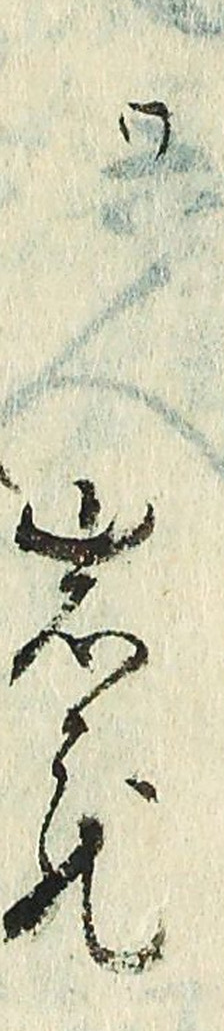同岩蔵
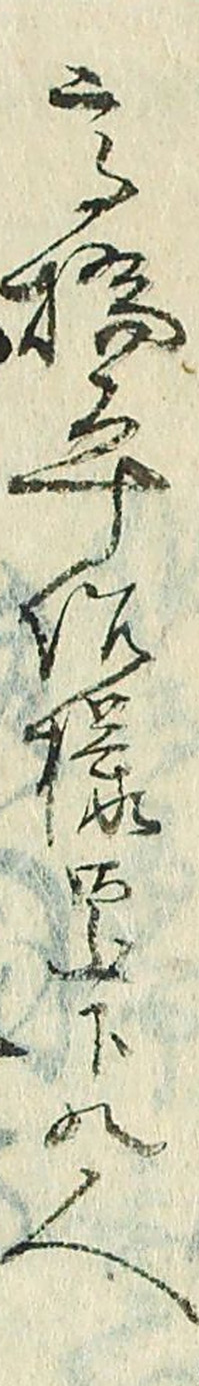高橋平作様御上下八人
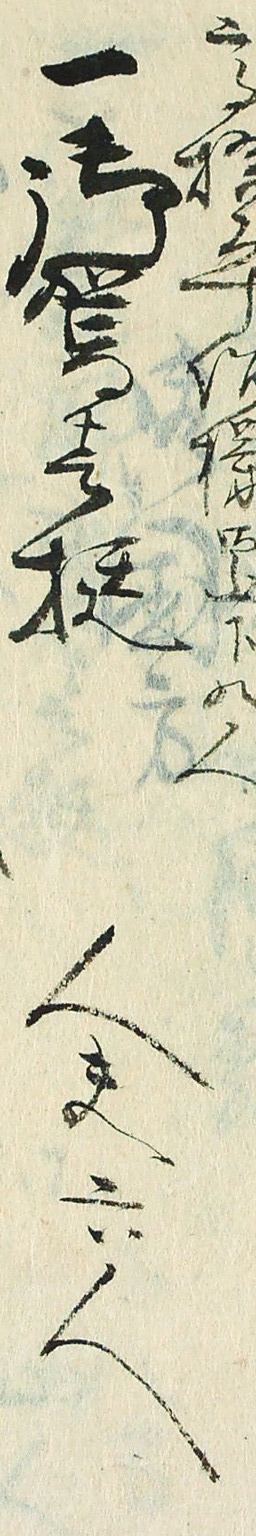一御駕壱挺人夫六人
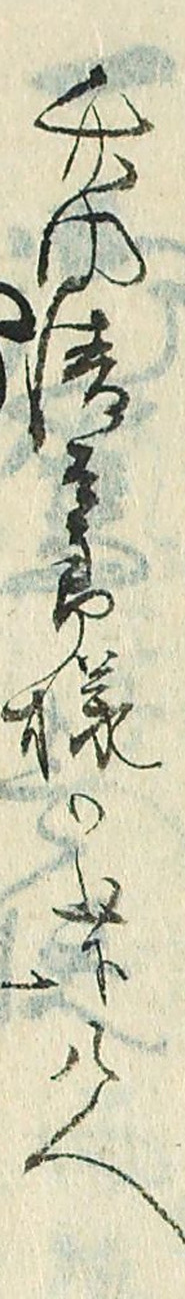竹内清太郎様御上下八人
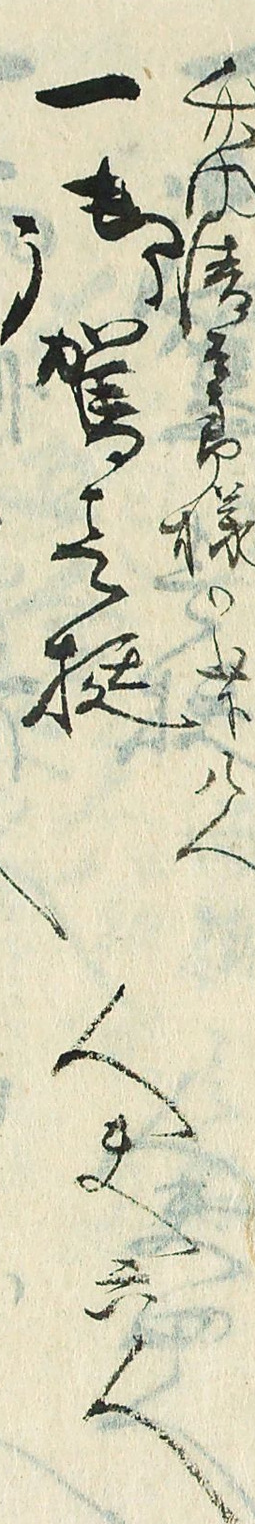一御駕壱挺人夫六人
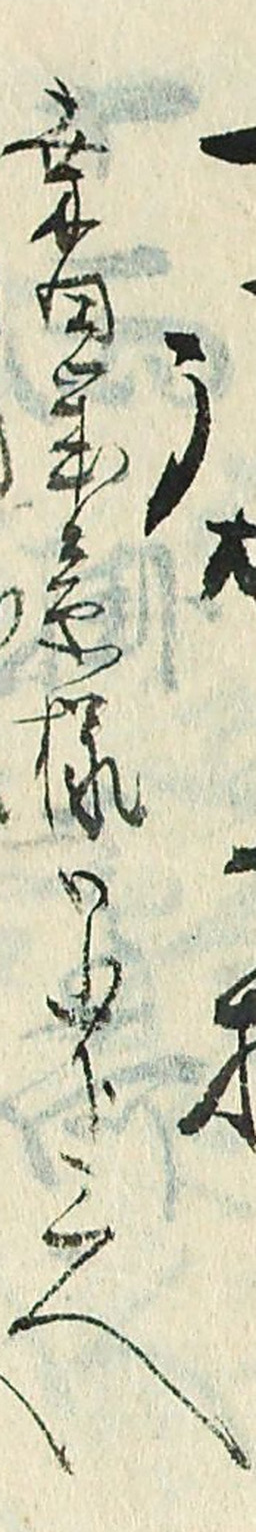桑田歳兵衛様御上下三人
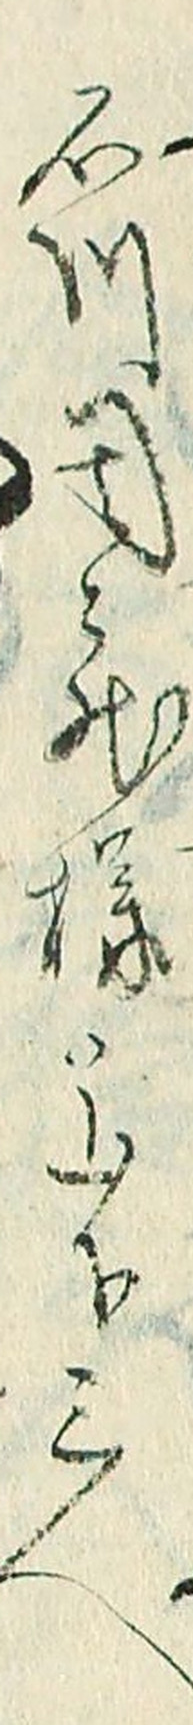石川周蔵様御上下三人
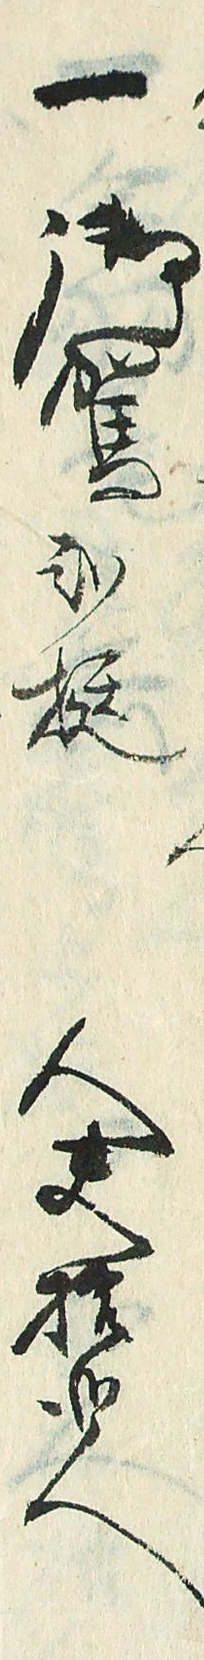一御駕弐挺人夫拾弐人

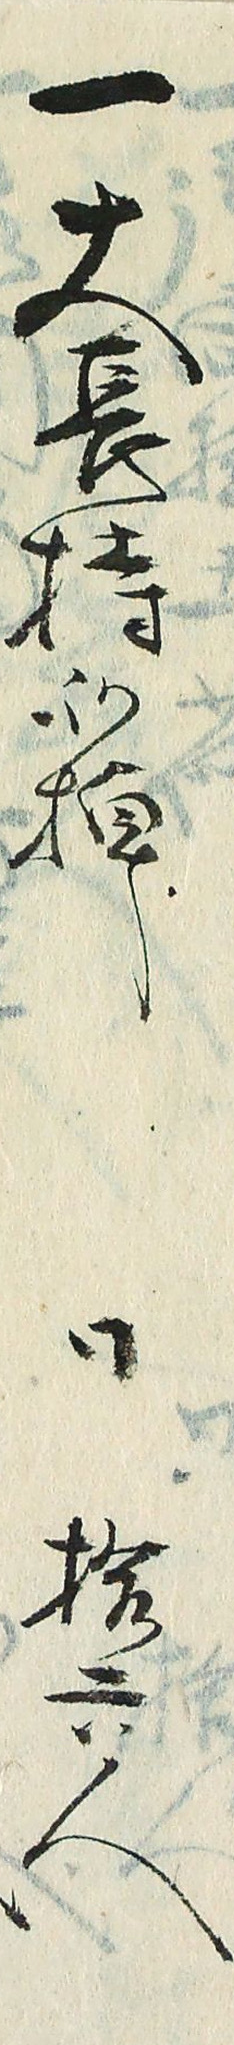一大長持弐棹同拾六人
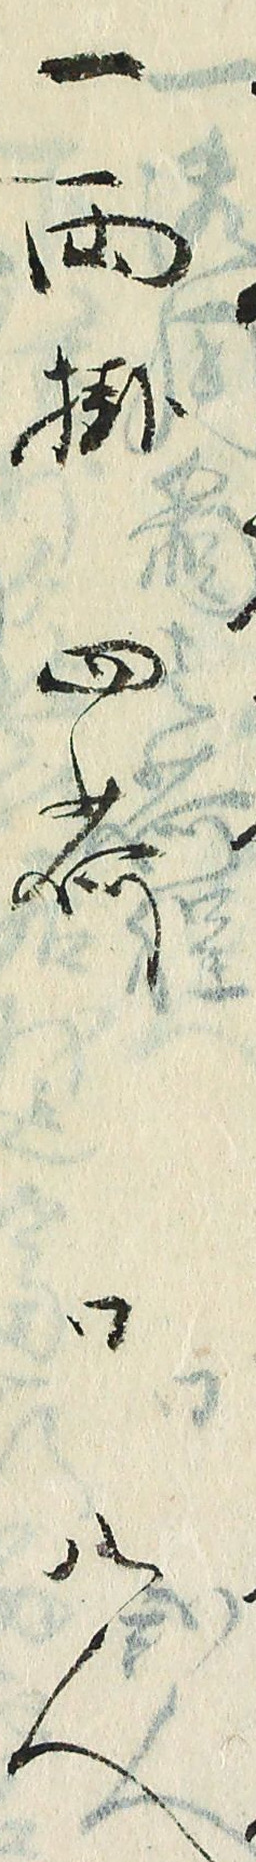一両掛四荷同八人
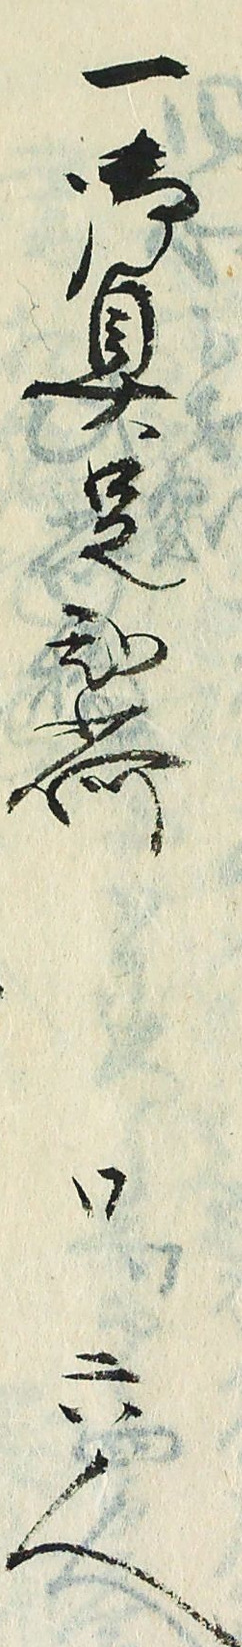一御具足弐荷同六人
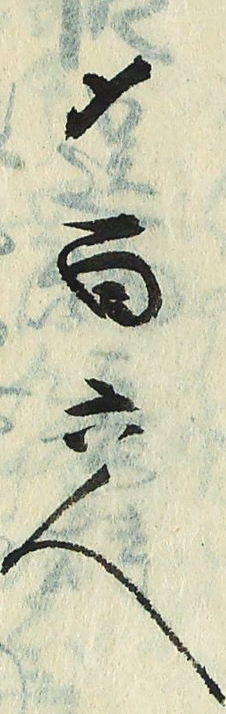〆百六人
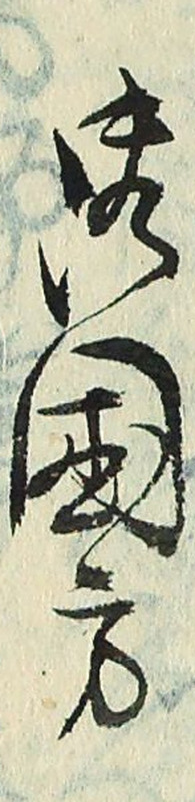御国方
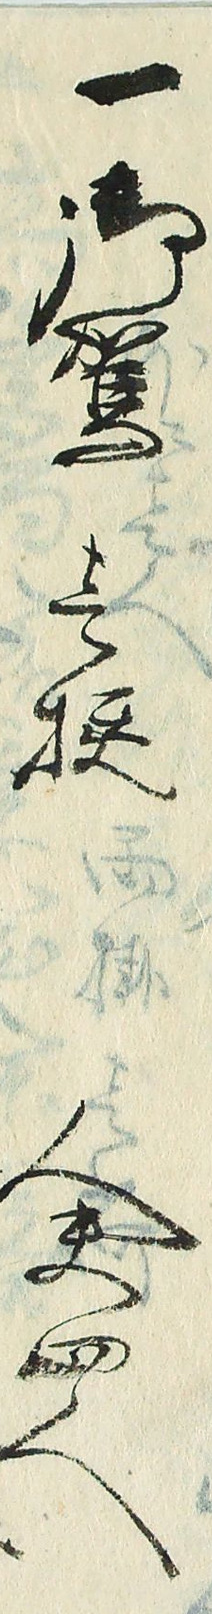一御駕壱挺人足四人
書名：公辺御役人為御廻浦御立越諸御用一巻
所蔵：鳴門教育大学 Naruto University of Education
